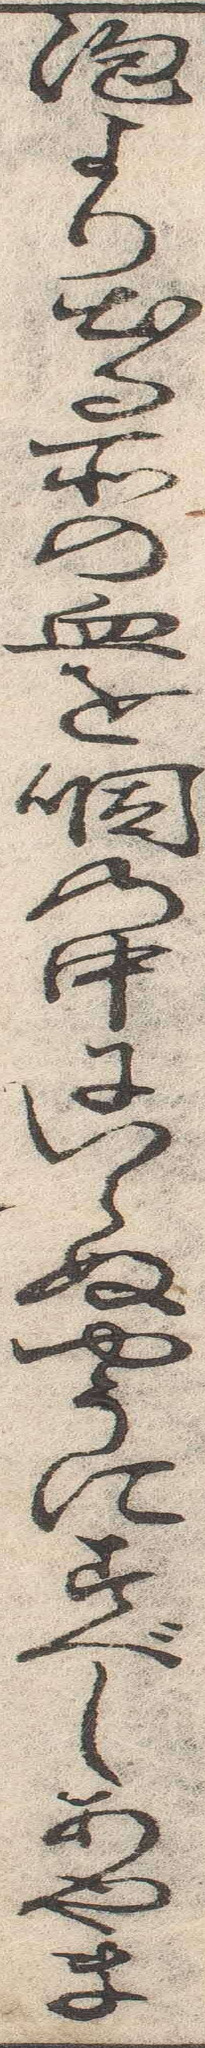泡より出る所の血を咽の中にいらぬやうにすべしあやま
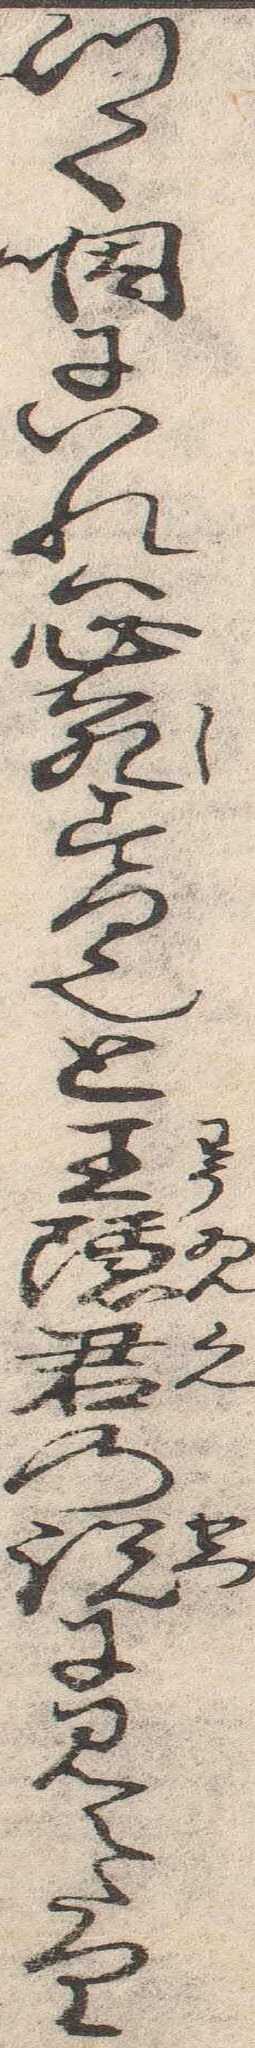つて咽にいれは必死する也と王隠君の説に見えたり
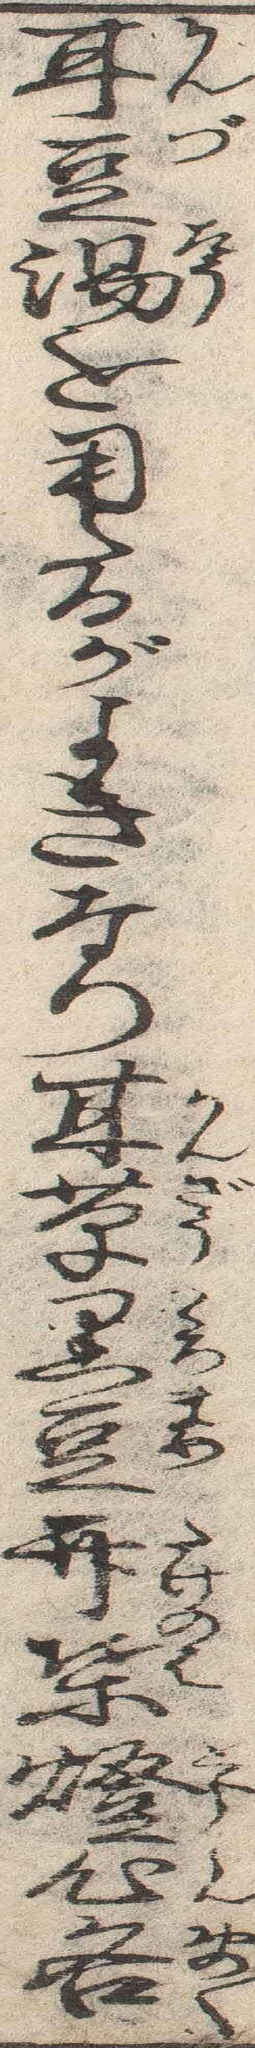甘豆湯を用たるがよきなり甘草黒豆竹葉燈心各
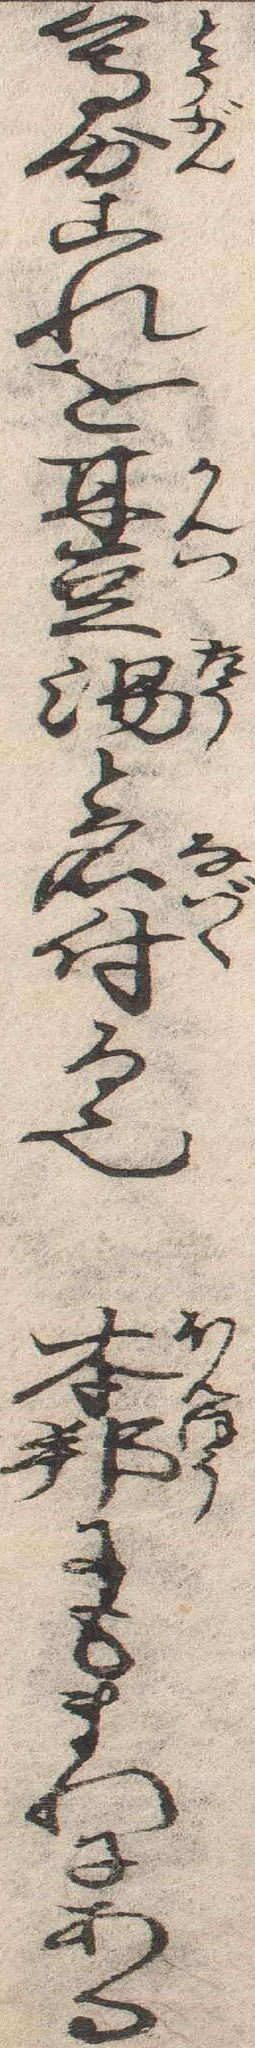等分これを甘豆湯と名付る也本邦にもまれにある
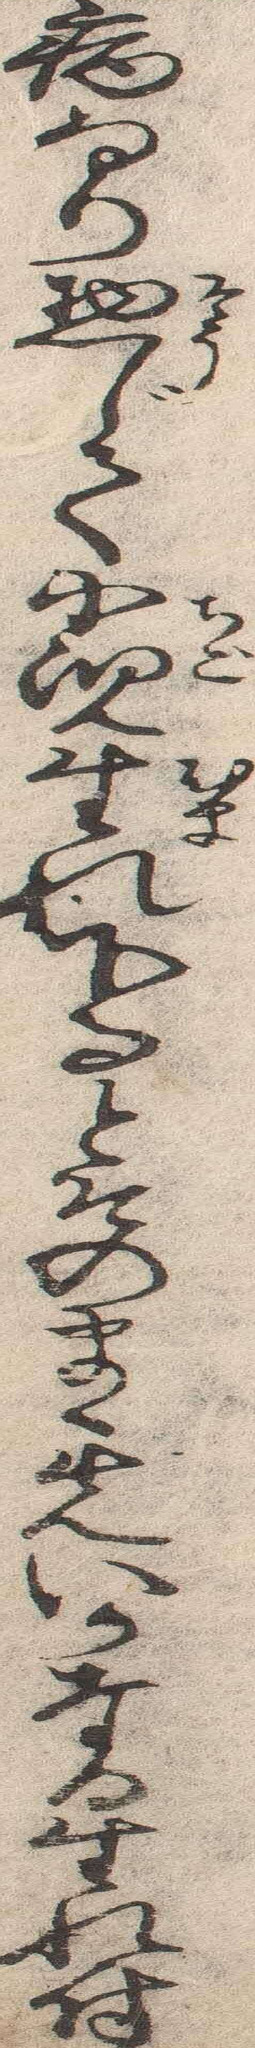病なり惣じて小児生れ下るとそのまゝ先いかなる生れ付
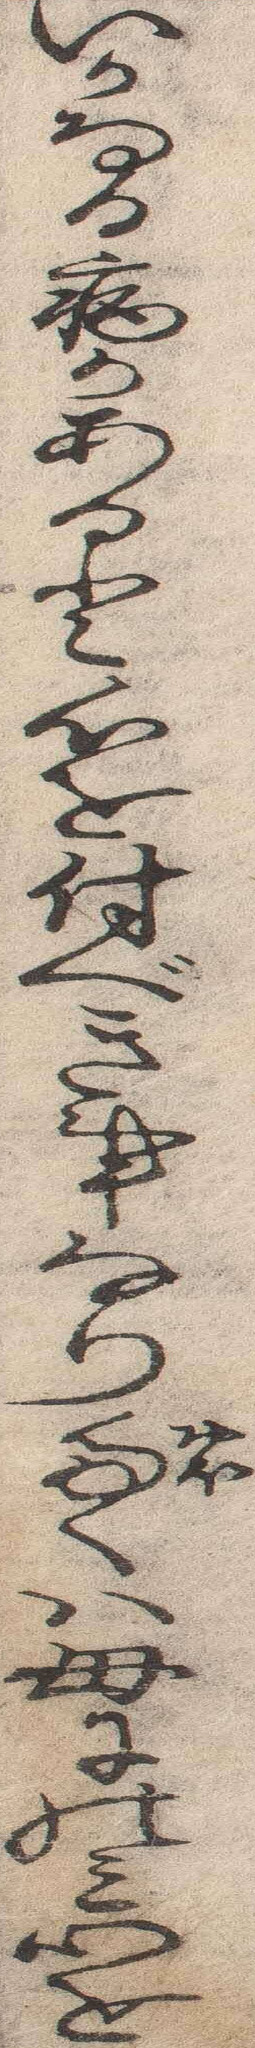いかなる病かあると心を付べき事なり多くは母にのみ心を

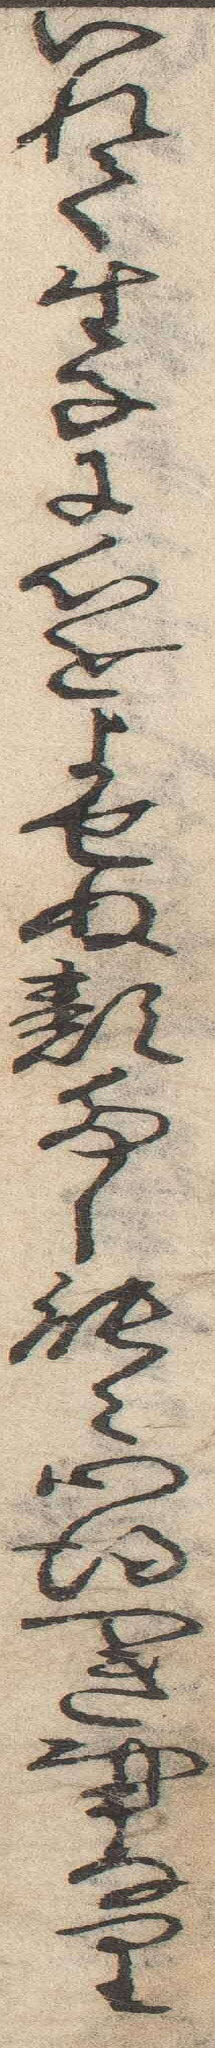いれて生子に心をよせぬ類多し能々心得へき事なり
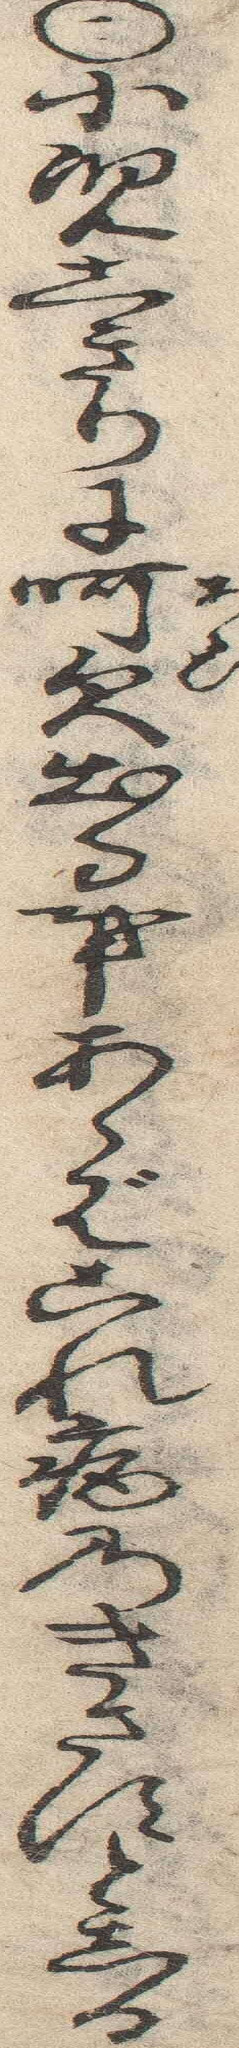○小児しきりに呵欠出る事あらばこれ病のきさすとしる
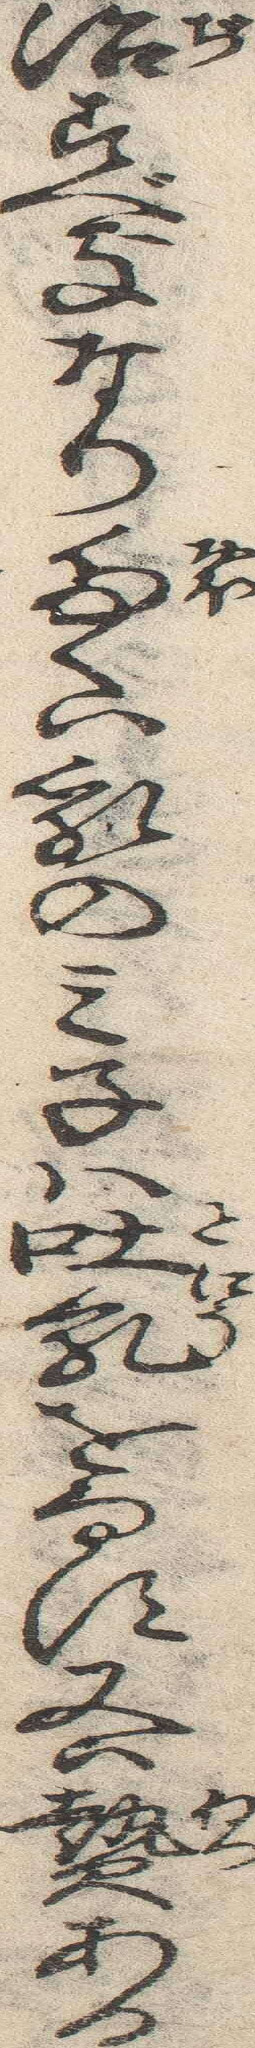治すべきなり多くは乳のみ子は吐乳をなす又は熱ある
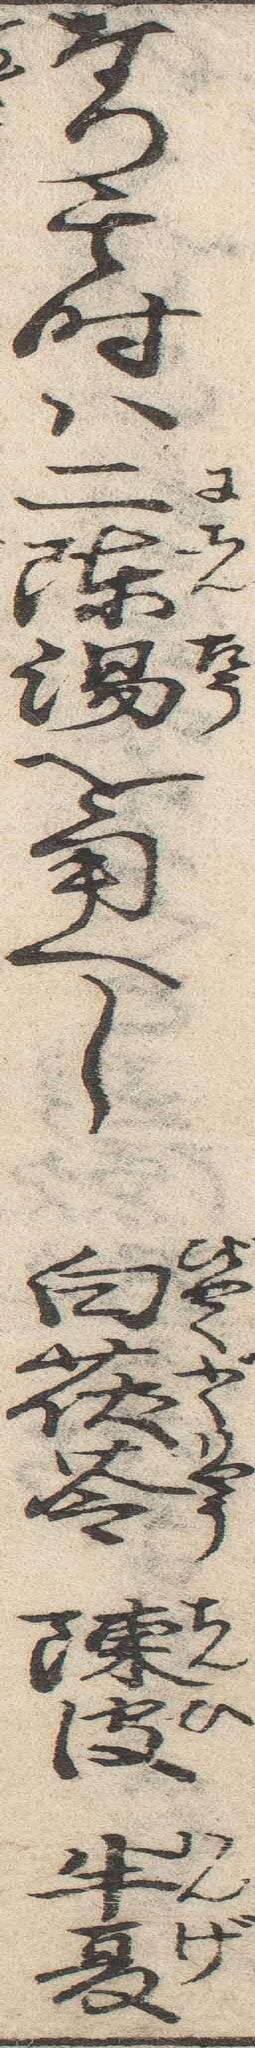なり其時は二陳湯を用へし白茯苓陳皮半夏
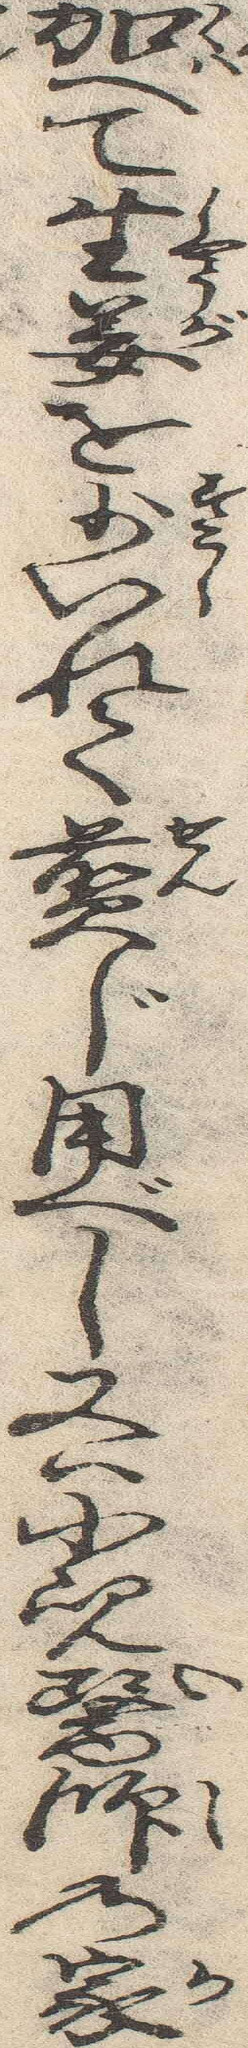加へて生姜を少いれて煎じ用べし又は小児医師の家
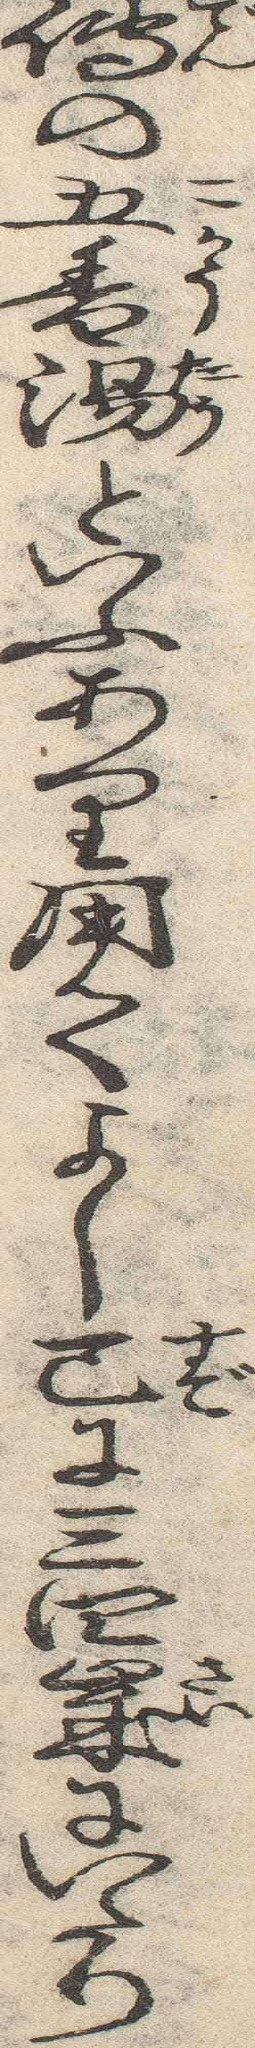伝の五香湯といふあり用てよし已に三四歳にいたり
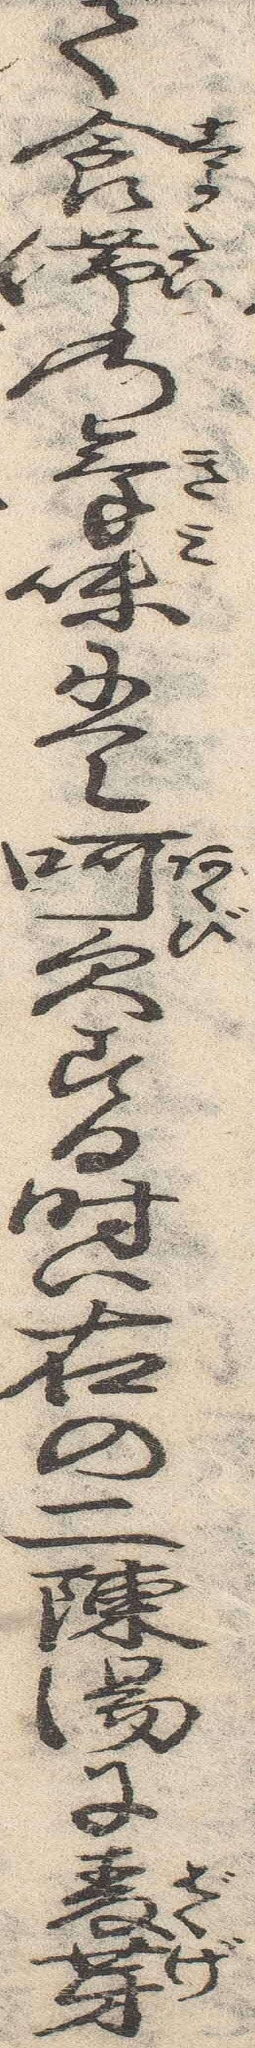て食滞の気味にて呵欠する時は右の二陳湯に麦芽
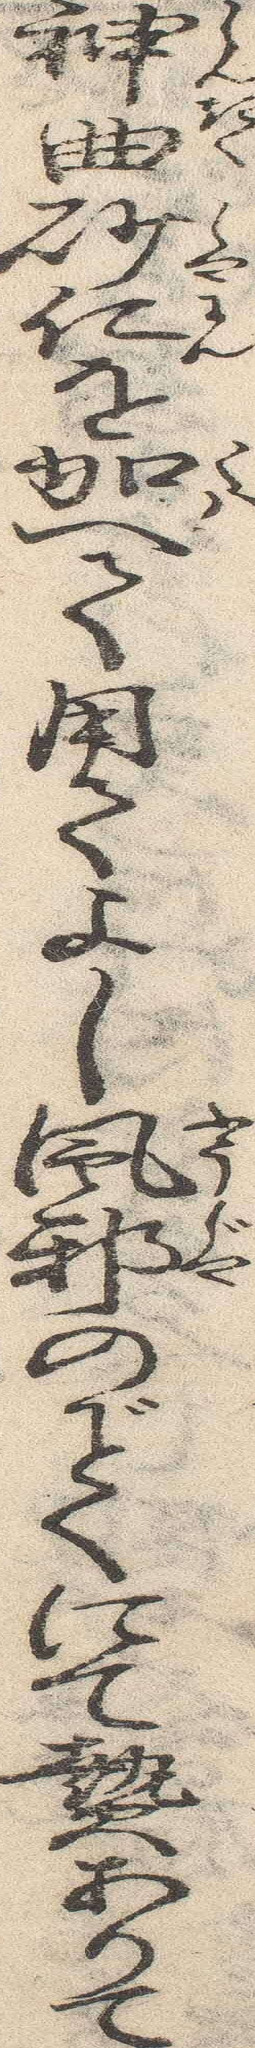神曲砂仁を加へて用てよし風邪のごとくにて熱ありて
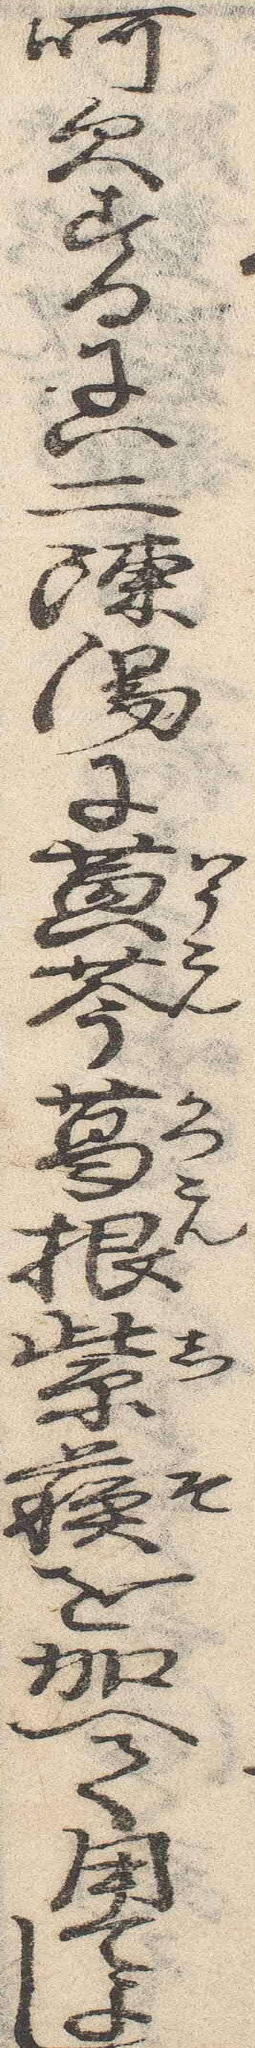呵欠するには二陳湯に黄芩葛根紫蘇を加へて用てよし

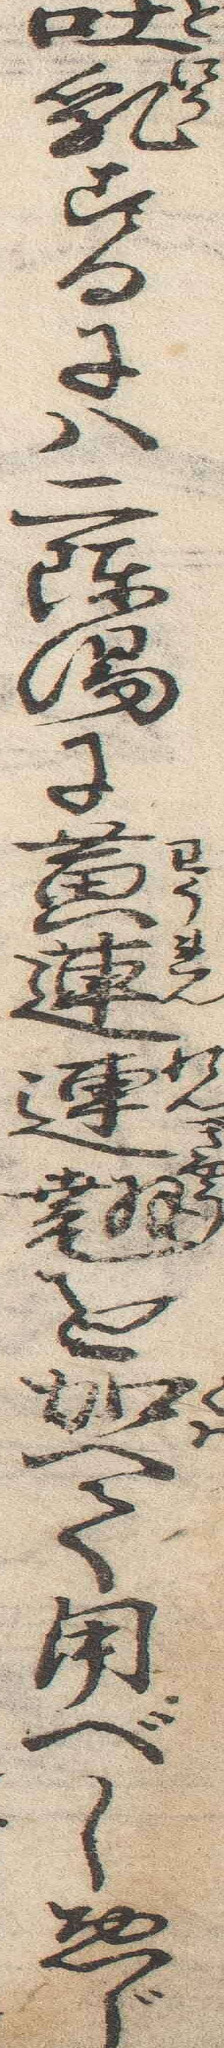吐乳するには二陳湯に黄連連翹を加へて用べし総じ
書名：小児必用養育草
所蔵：東京学芸大学附属図書館 国文学研究資料館
